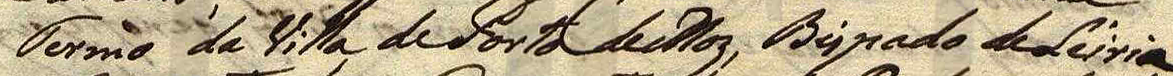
Termo da Villa de Porta de Moz, Bispado de Leiria,
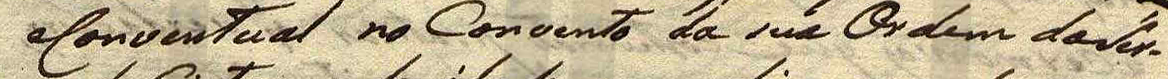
e Conventual no Convento da sua Ordem da Ser
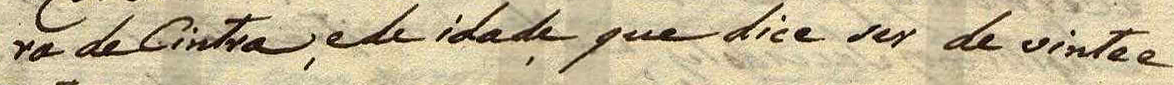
ra de Cintra, e de idade que dice ser de vinte e
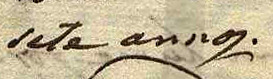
sete annos.
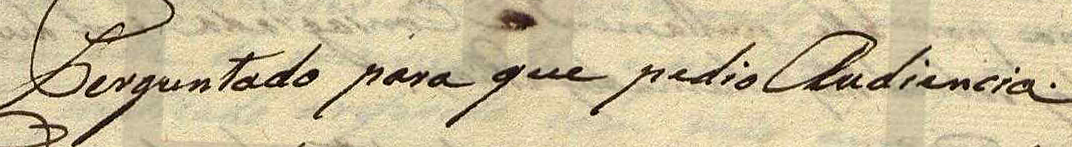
Perguntado para que pedio Audiencia.
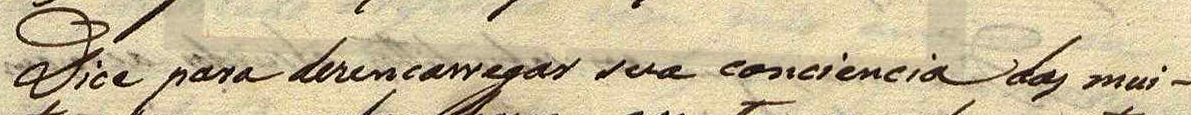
Dice para dezencarregar sua conciencia das mui
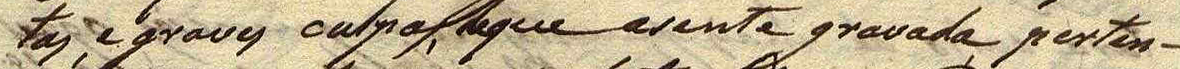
tas, e graves culpas, de que a sente gravada, perten
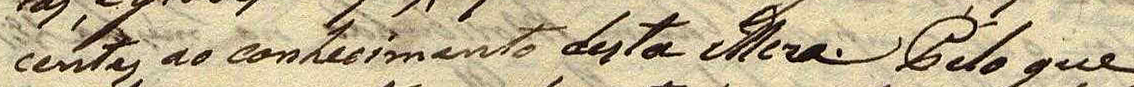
centes ao conhecimento desta Meza. Pelo que
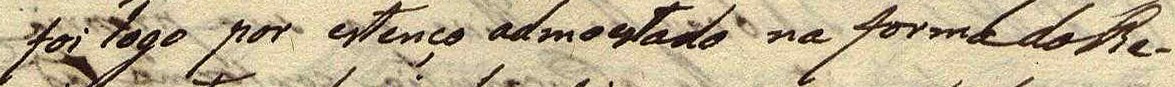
foi logo por estenço admoestado na forma do Re
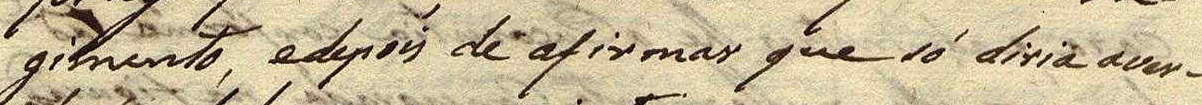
gimento, e depois de afirmar que só diria a ver
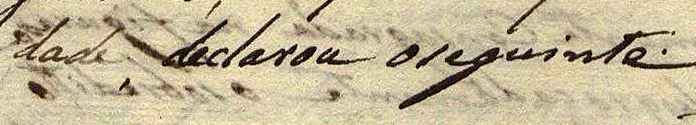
dade, declarou o seguinte.
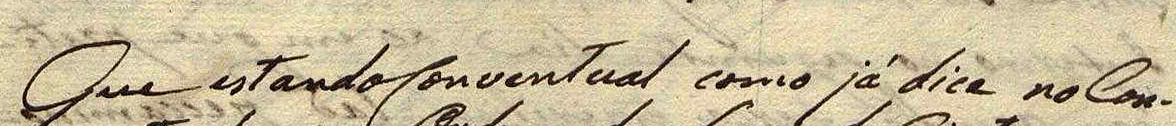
Que estando Conventual como já dice no Con
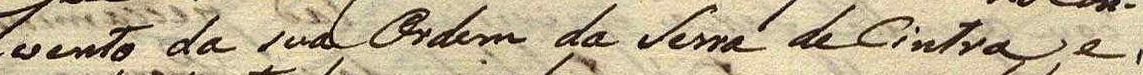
vento da sua Ordem da Serra de Cintra, e
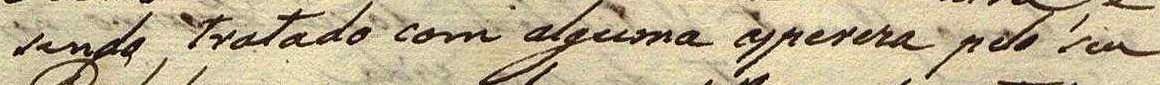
sendo tratado com alguma aspereza pelo seu
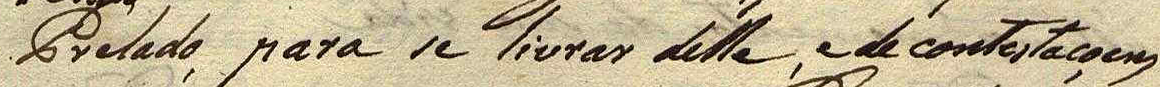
Prelado, para se livrar delle, e de contestaçoens
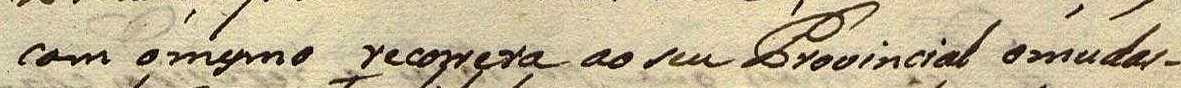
com o mesmo recorrera ao seu Provincial o mudas
